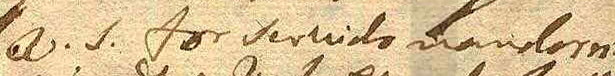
V. s. for seruido mandarme.
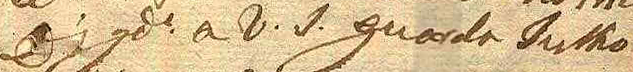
Ds̄ gd.e a V. s. Guarda Iulho
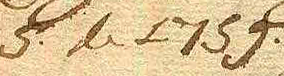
5. de 1759.
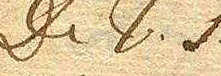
De V. s.
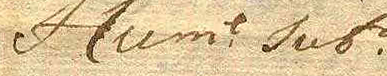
Hum.e sub̄.o
